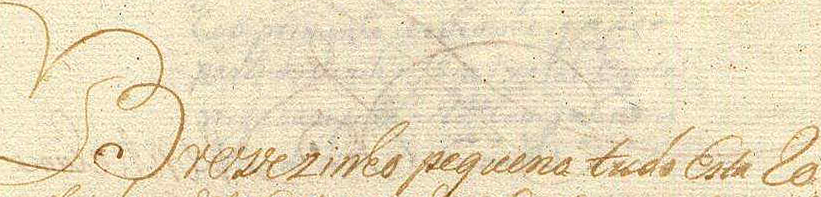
Brevezinho pequeno tudo Esta Ro
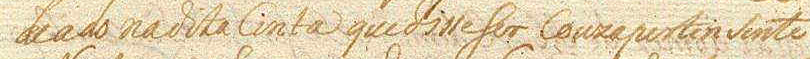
deado na dita Cinta que disse ser couza pertensente
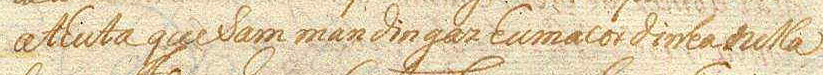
a thuta que Sam mandingas huma cordinha nella
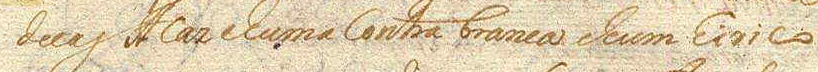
duas Acaz e huma Contra branca e hum hirico
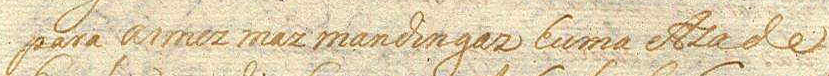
para as mezmaz mandingaz huma Aza de
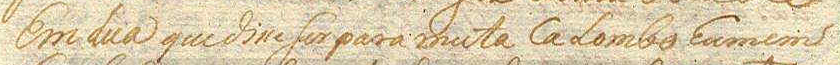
Emdua que disse ser para muta CaLombo hum em
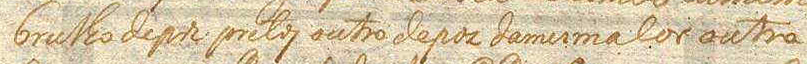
brulho de poz pretos outro de poz da mesma Cor outro
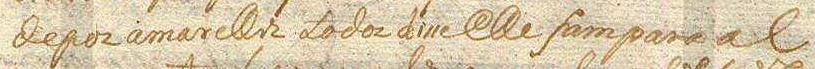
de poz amarelloz todoz disse Elle sam para al
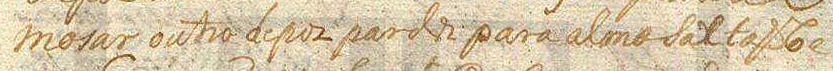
mosar outro de poz pardos para almosar taõbe
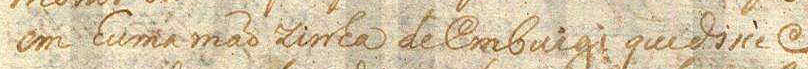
em huma maõ tinha de Embuigi que disse E
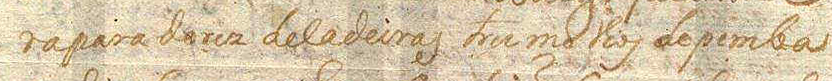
ra para dorez de Cadeiras tres molhos de pemba
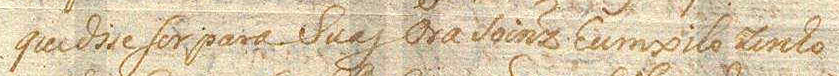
que dise ser para Suas Orasoin̄z hum xilozinho
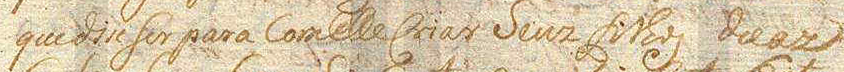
que dise ser para Com Elle Criar Seuz filhos duaz
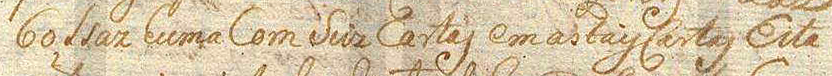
bolsaz huma Com Seiz Cartas em as tais Cartas Esta
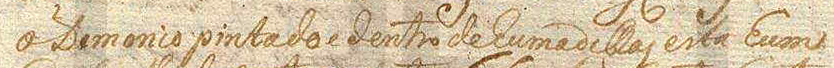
o Demonio pintado e dentro de huma dellas esta hum
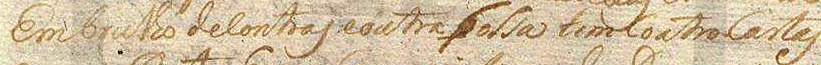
Embrulho de contras e outra bolsa tem Coatro Cartas
